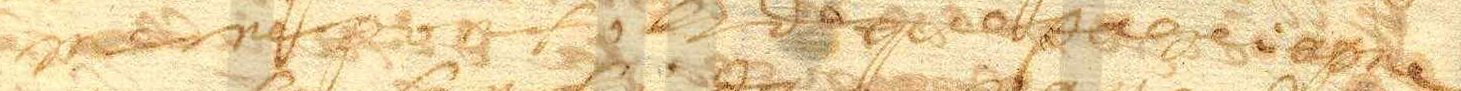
me reporto E de que pasei a pre
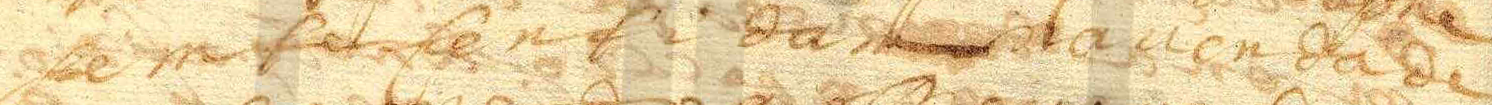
semte Certidam na uerdade
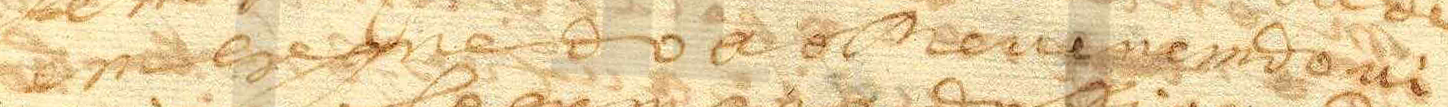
em segredo ao Reueremdo ui
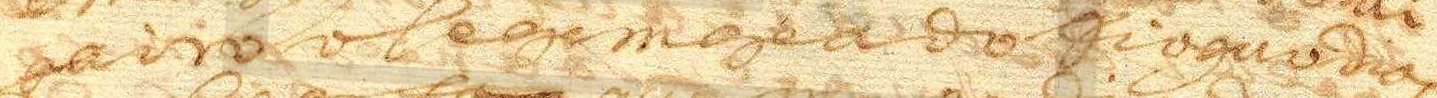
gairo o lesemseado Dioguo dias
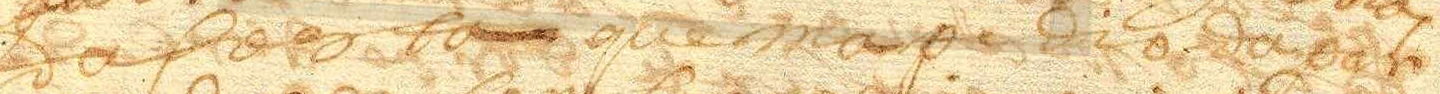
da Costa que ma pedio da par
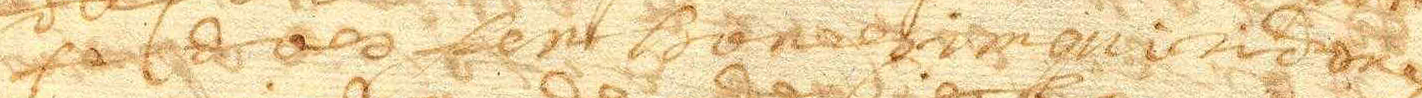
te dos senhores imquizidores
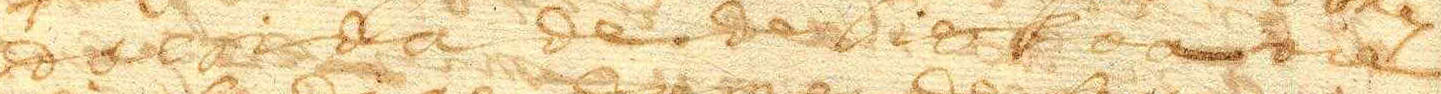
da sidade de lisboa oie
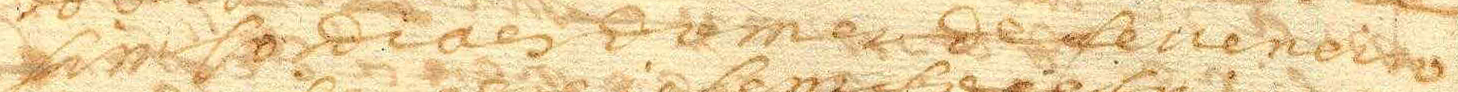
simco dias do mes de feuereiro
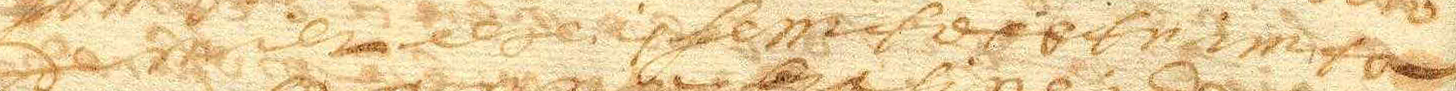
de mil e seissemtos e trimta
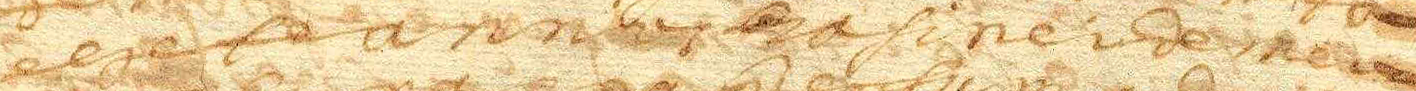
e sete annos E asinei de meu
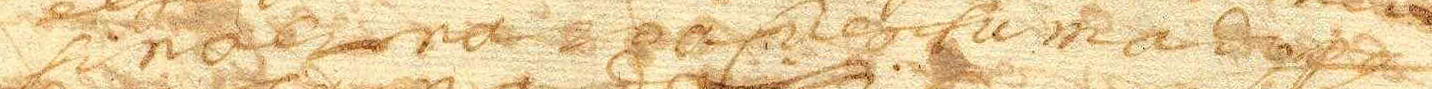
sinal razo aCustumado pg
